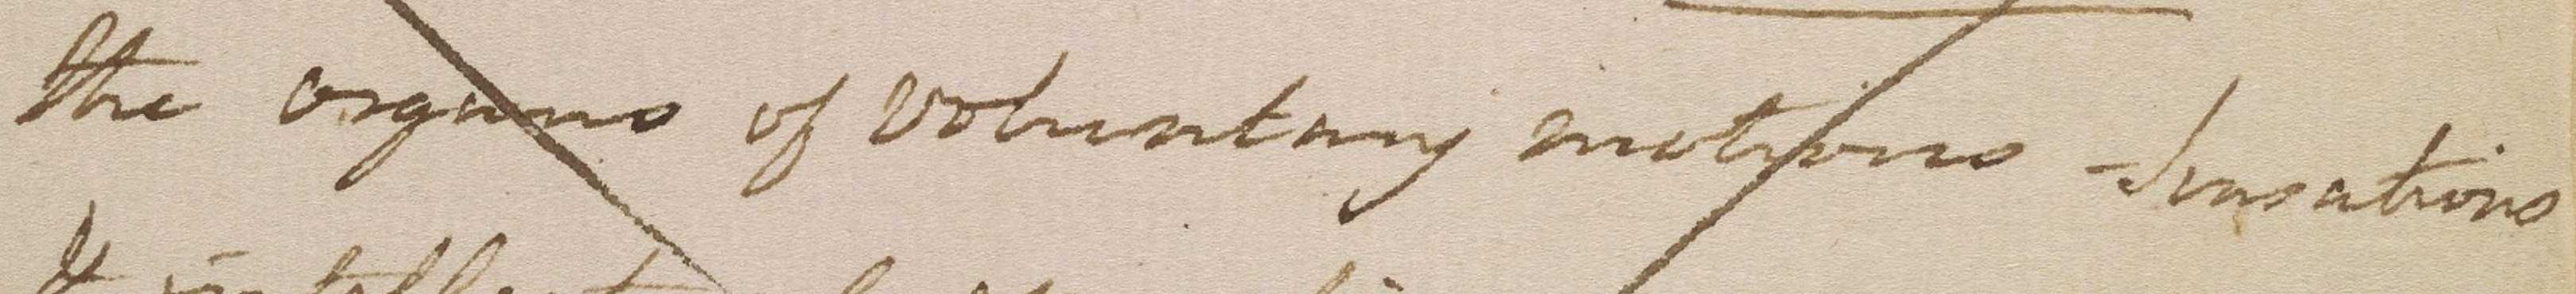the organs of voluntary motions, sensations,
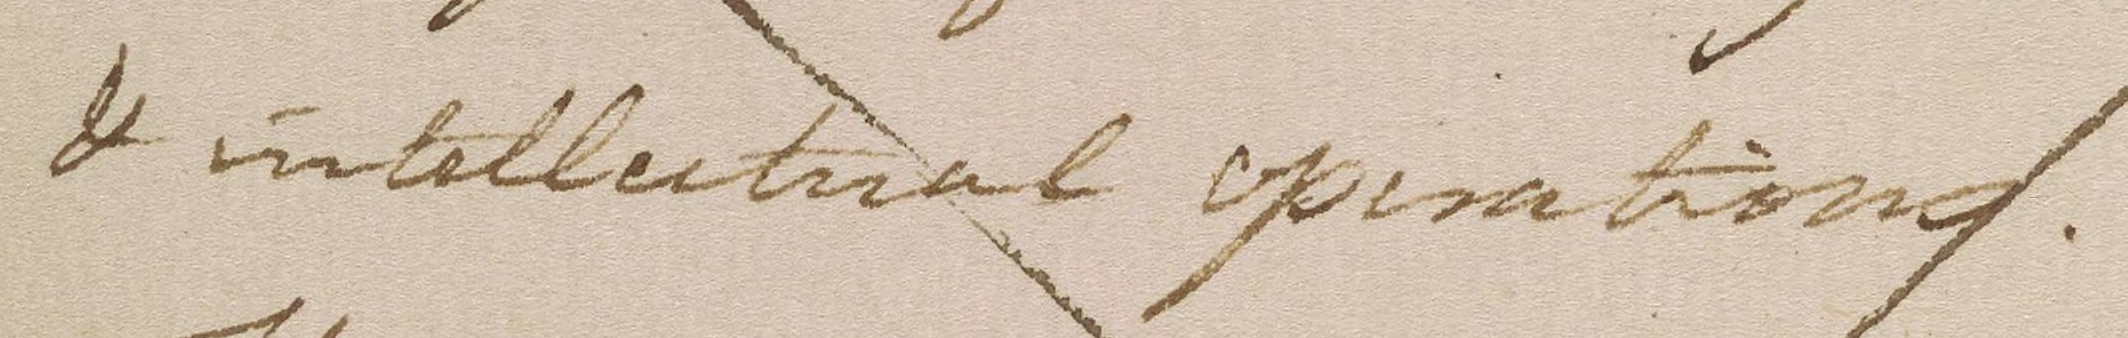& intellectual operations.
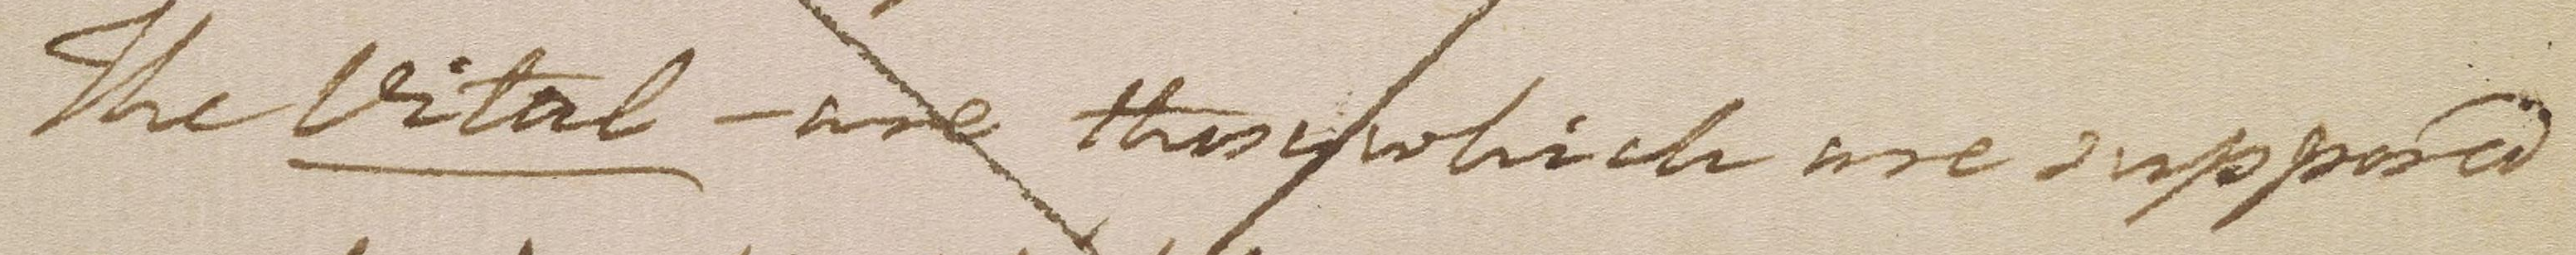The vital, are those which are supposed
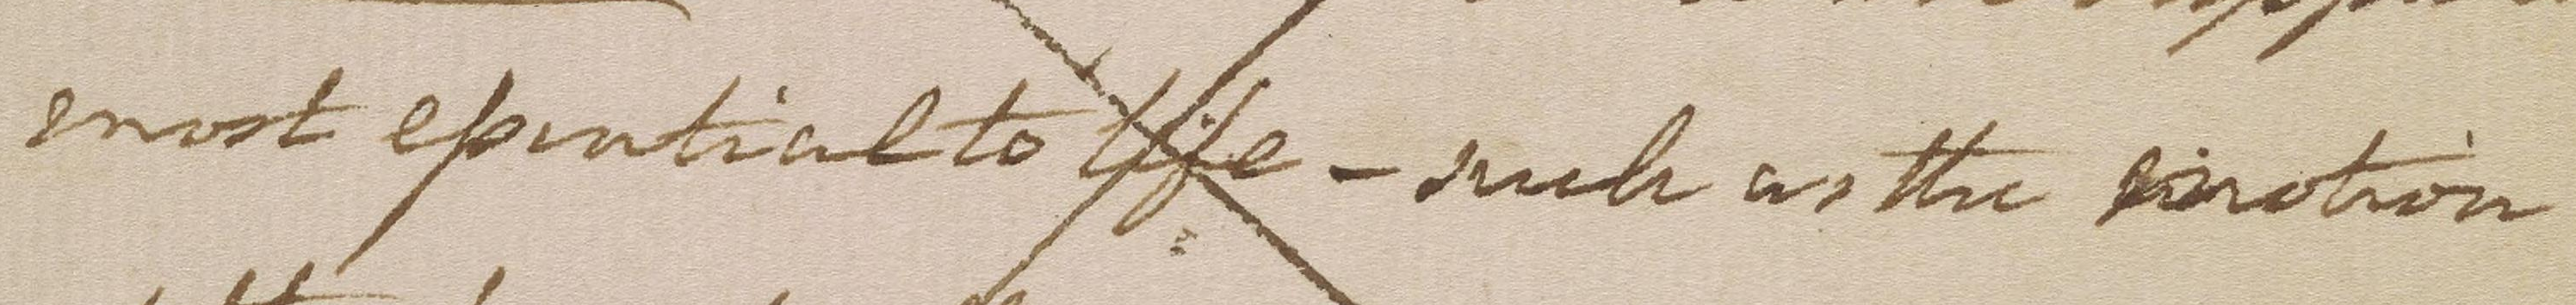most essential to life, such as the motion
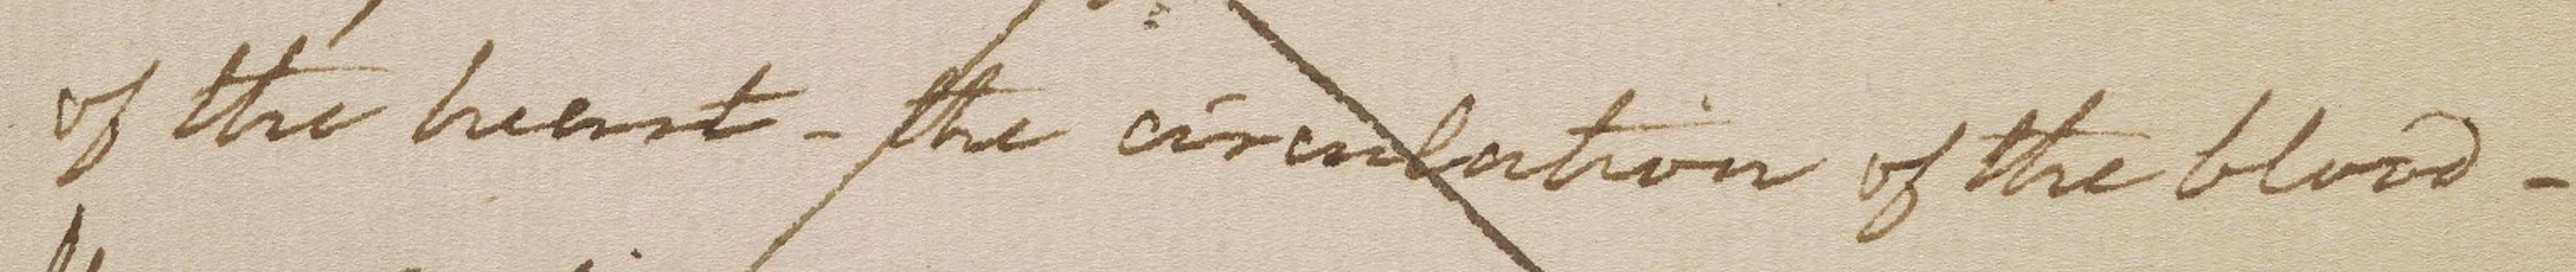of the heart- the circulation of the blood-
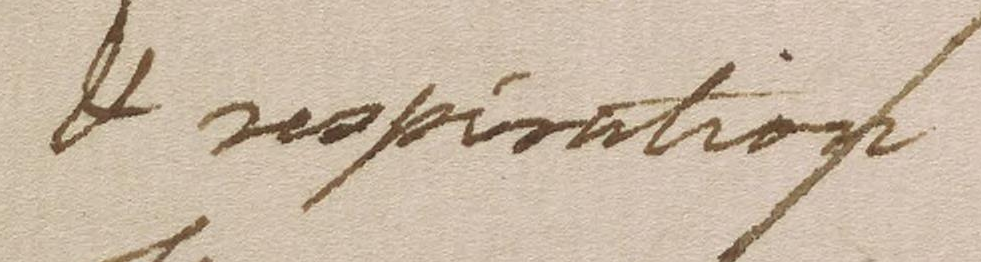& respiration.
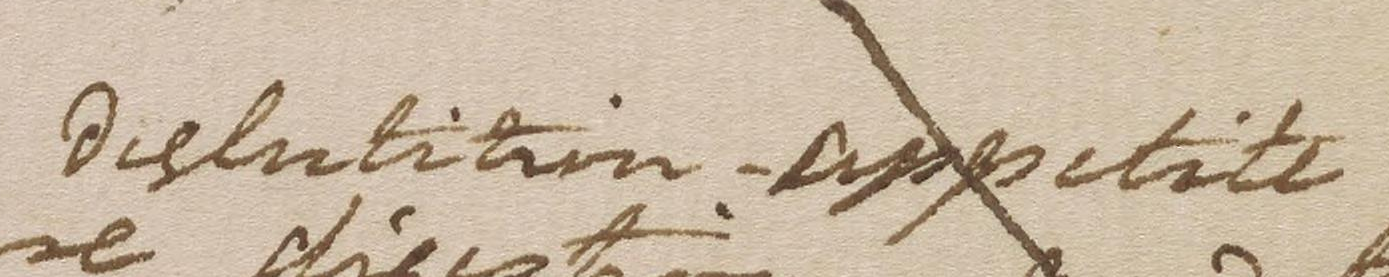dissentrition- appetite
